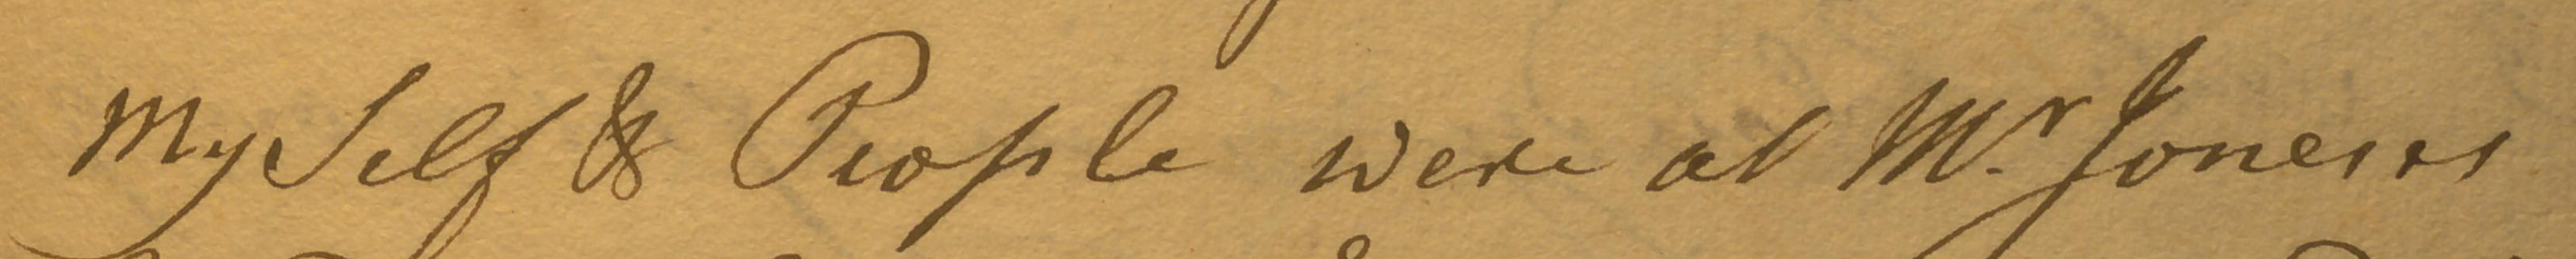My Self & People were at M^r. Joneses
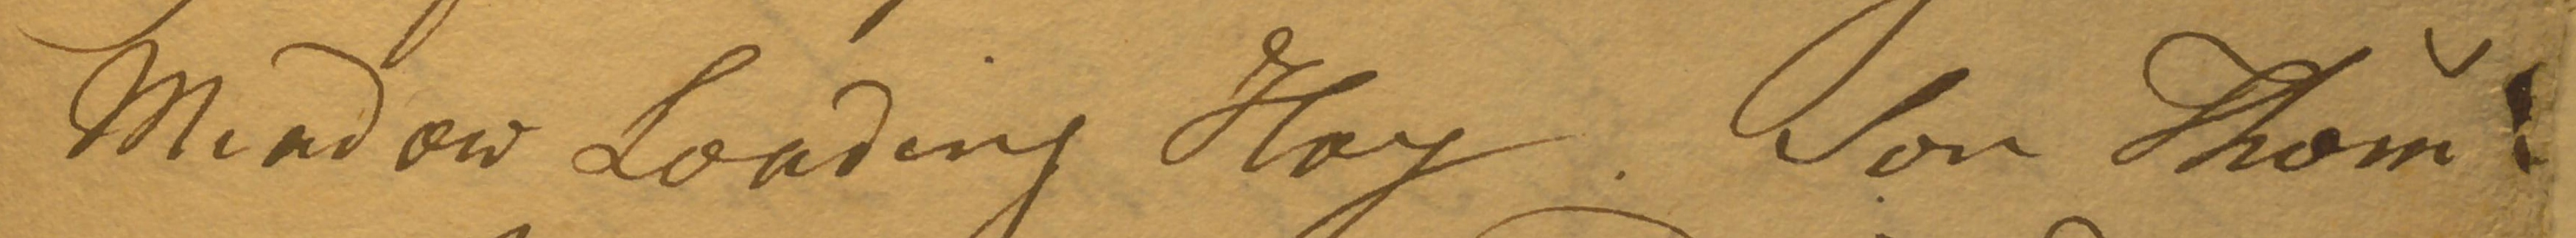Meadow Loading Hay Son Thom^s
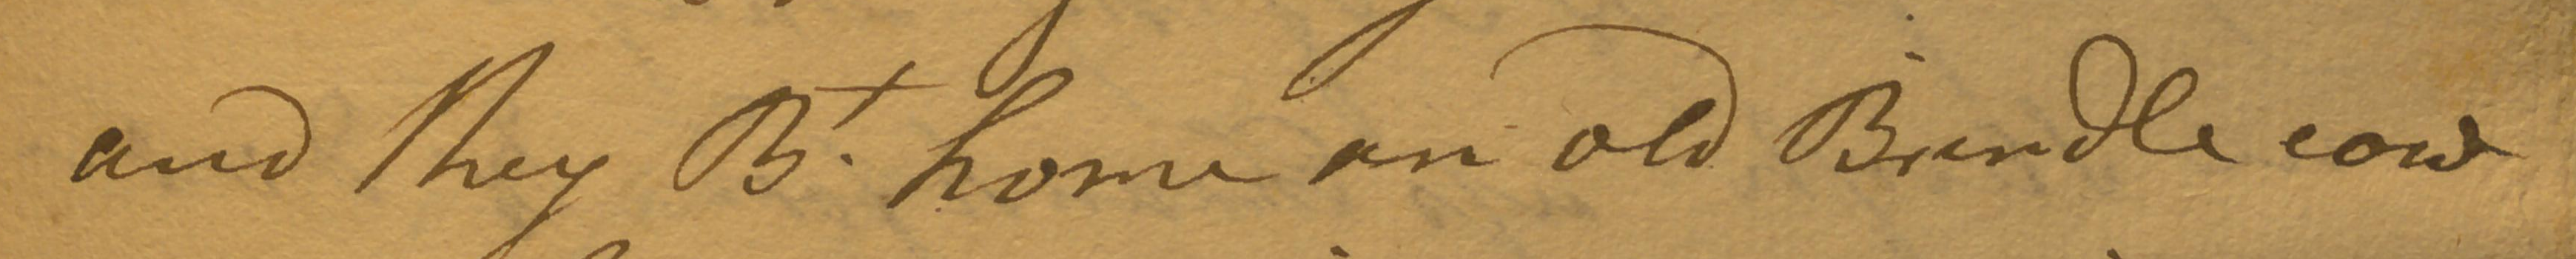and they B^t. home an old Brindle cow
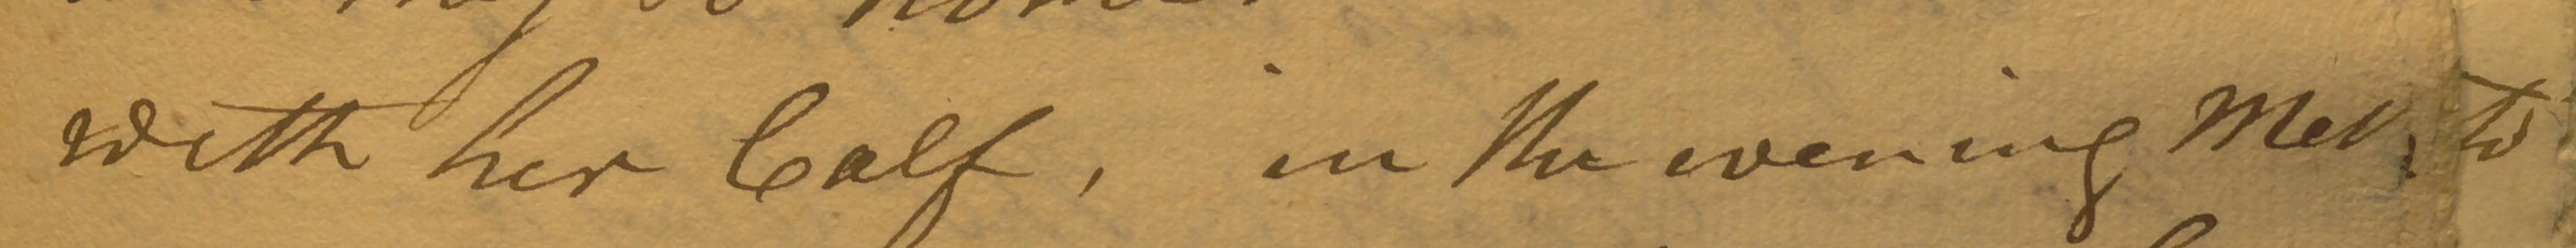with her Calf, in the evening Met
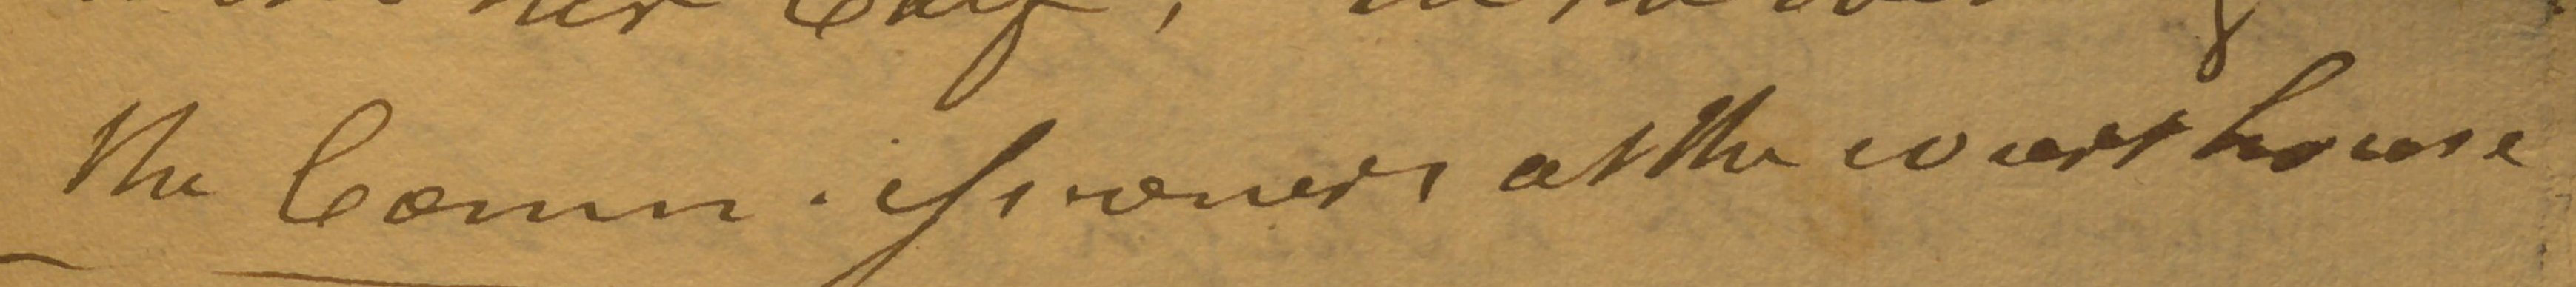the Commissioners at the court house
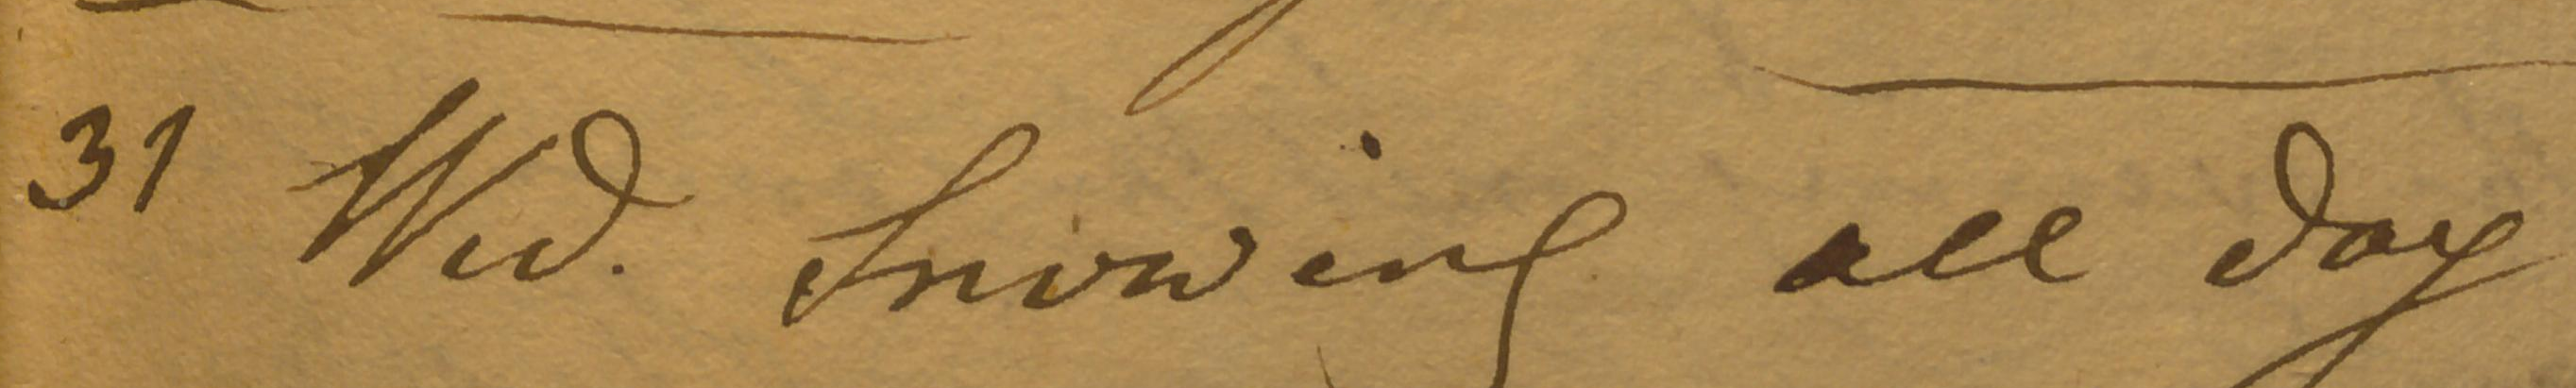31 Wed. Snowing all day
